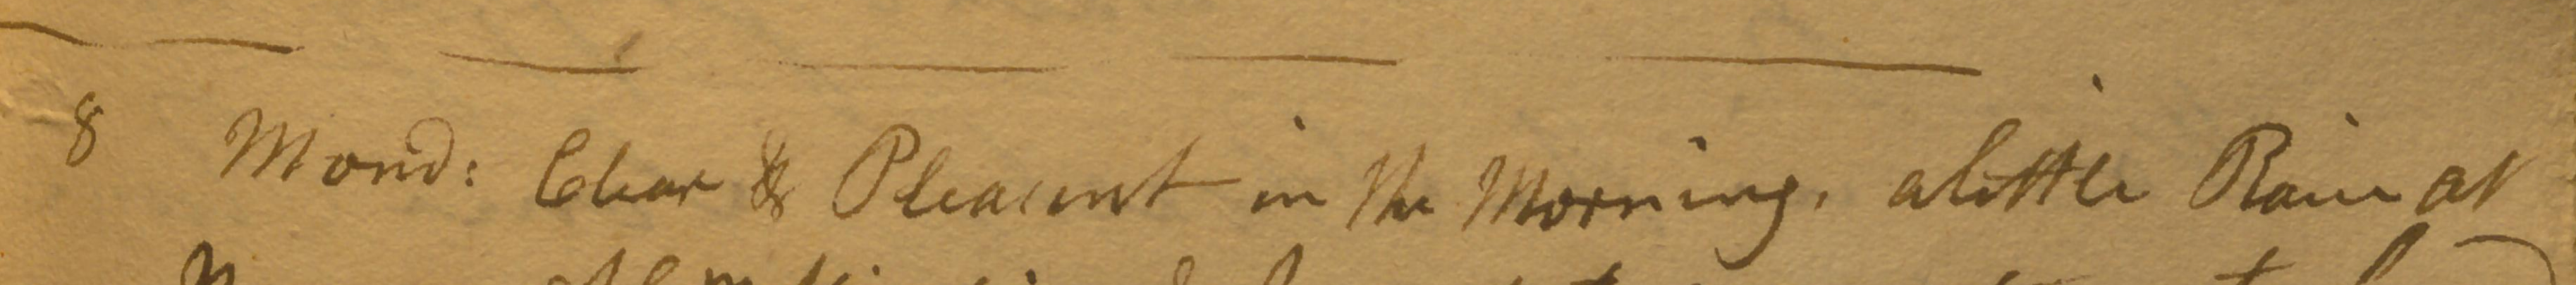8 Mond. Clear & Pleasent in the Morning. a little Rain at
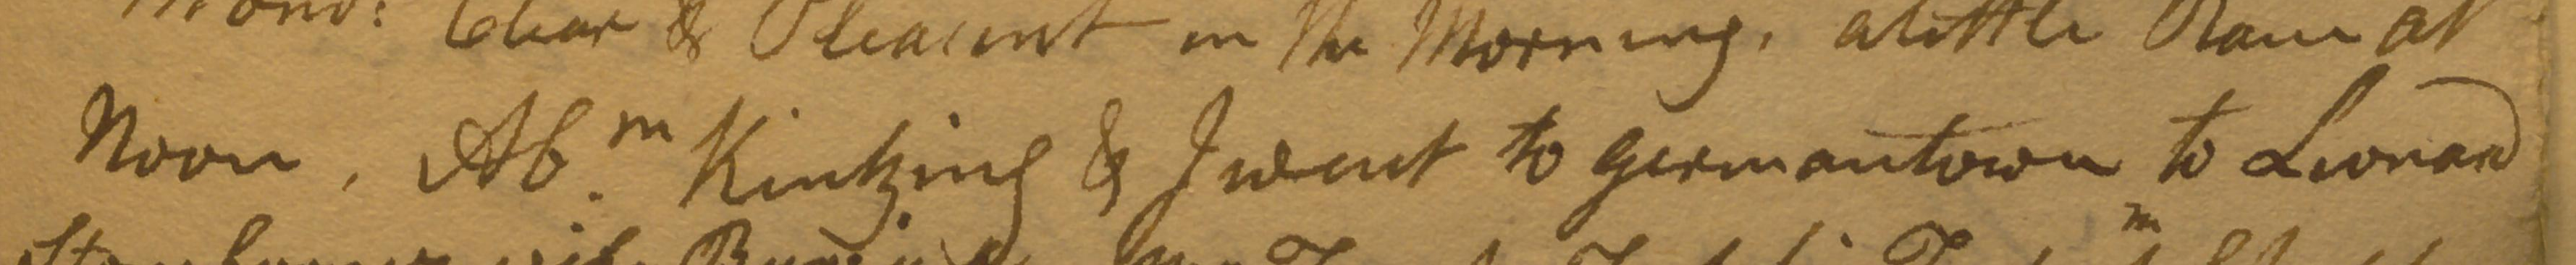Noon, Ab^m. Kintzing & I went to germantown to Leonard
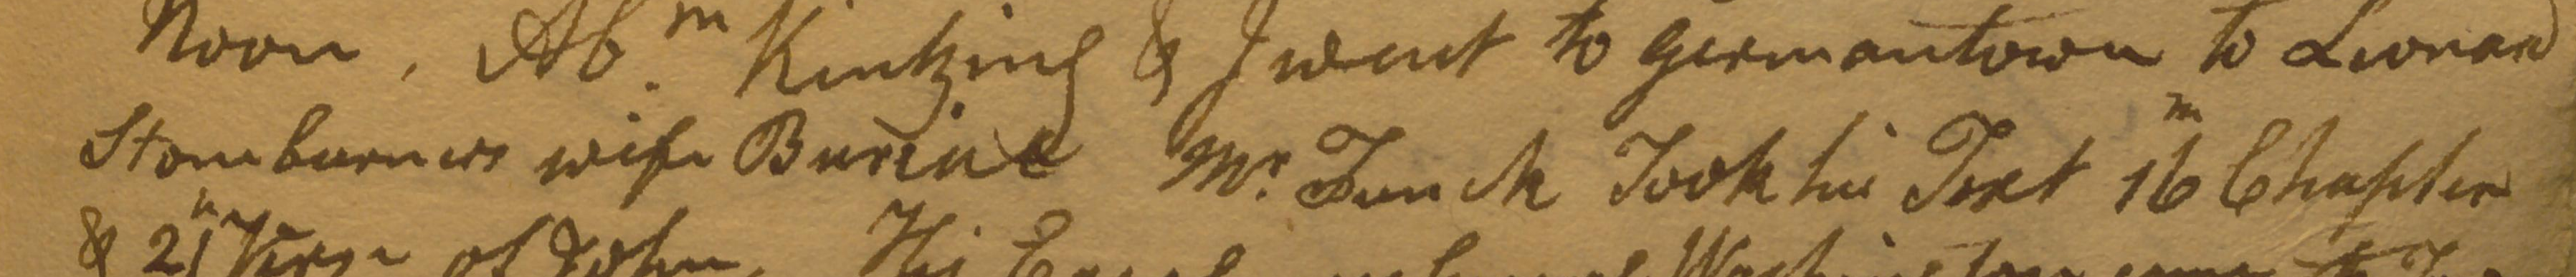Stoneburners wife Burial M^r. Tunck Took his Text 16^th Chapter
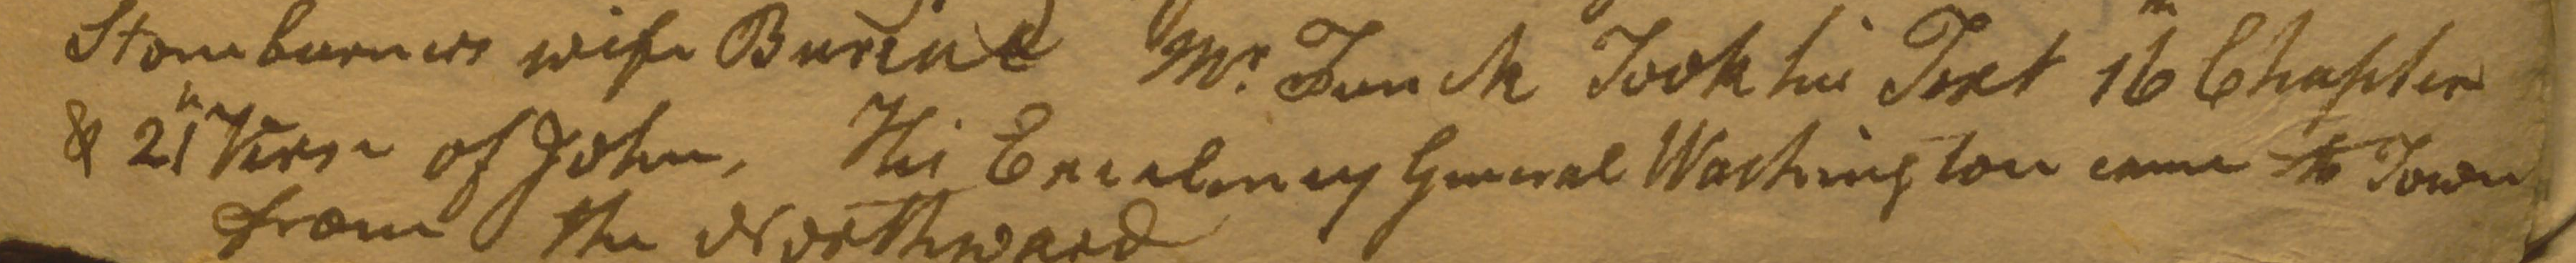& 21^th Verse of John, This Excellency General Washington came to Town
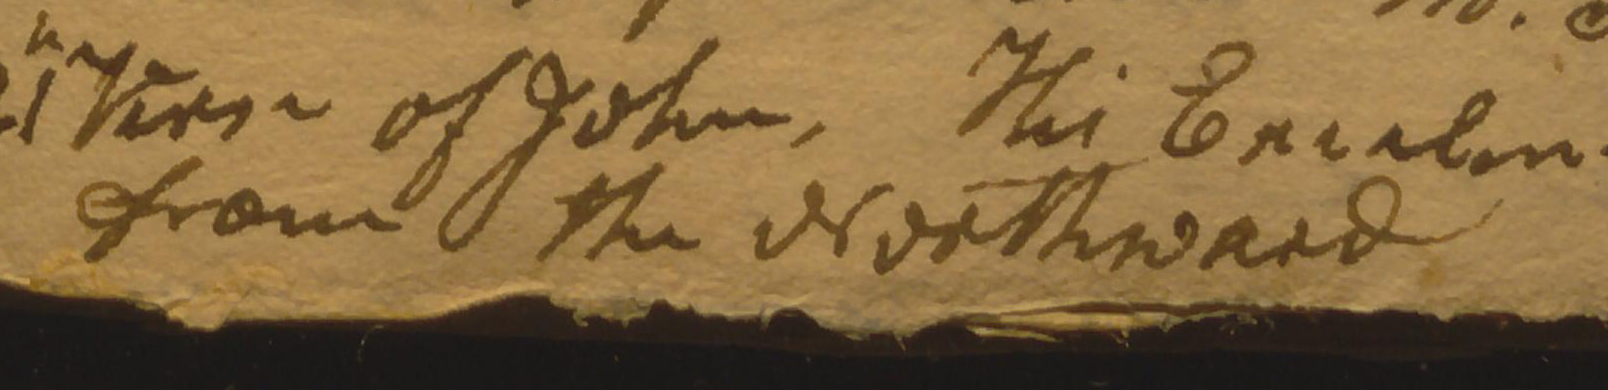from the Northward
